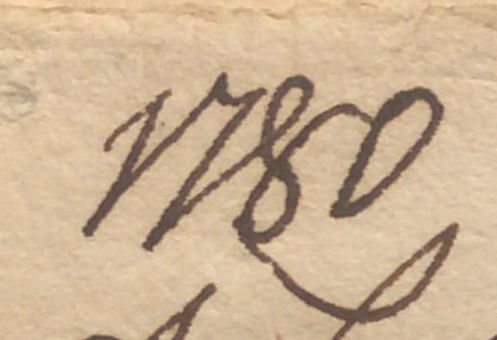1780
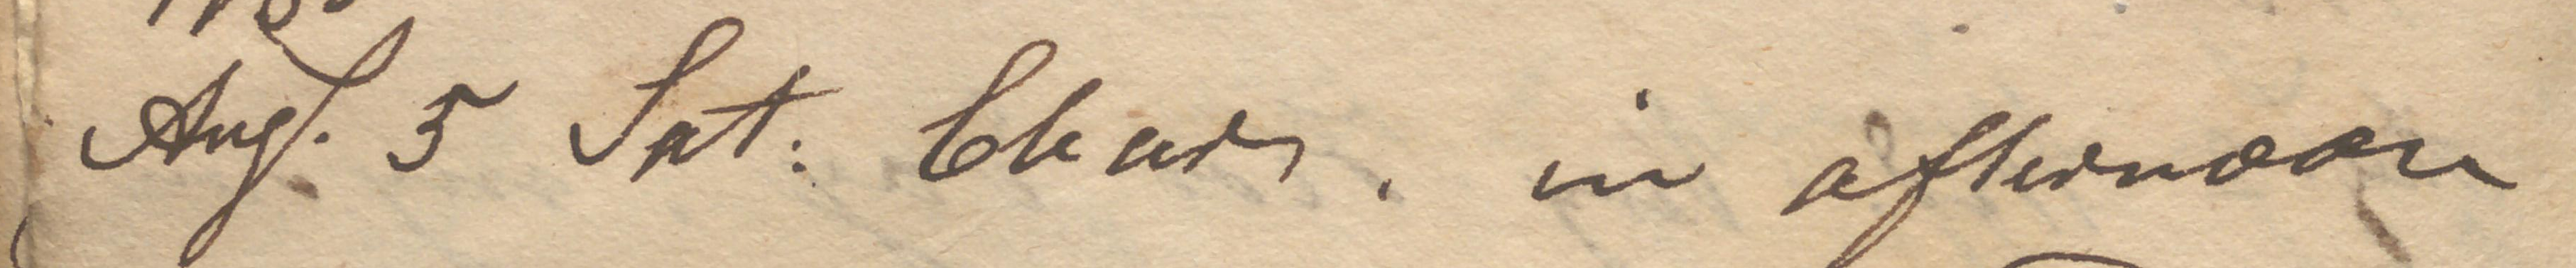Aug^t. 5 Sat. Clear, in afternoon
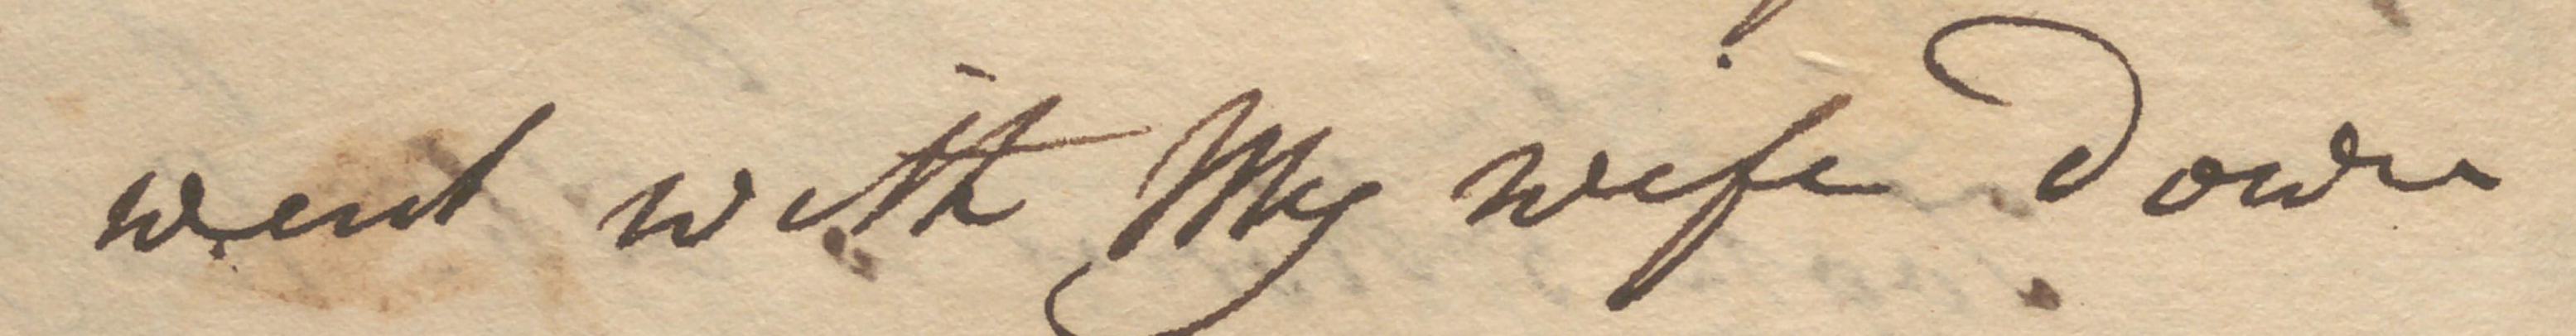went with My wife down
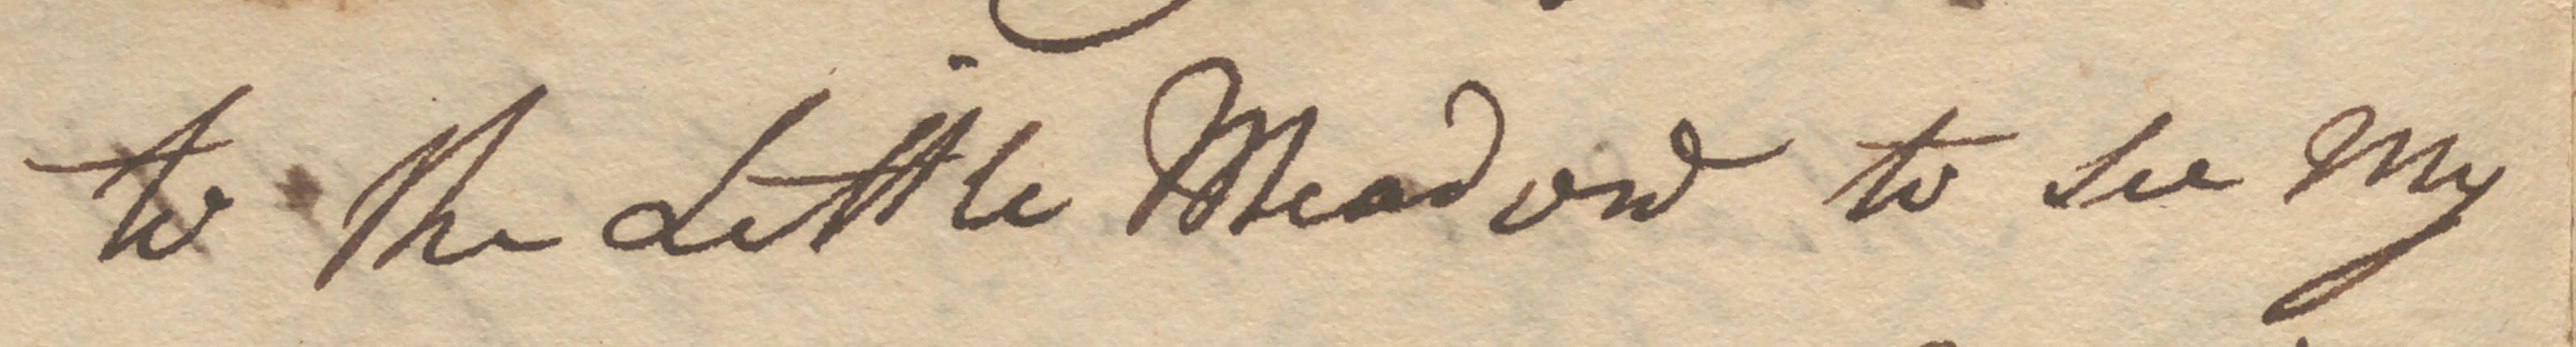to the Little Meadow to see My
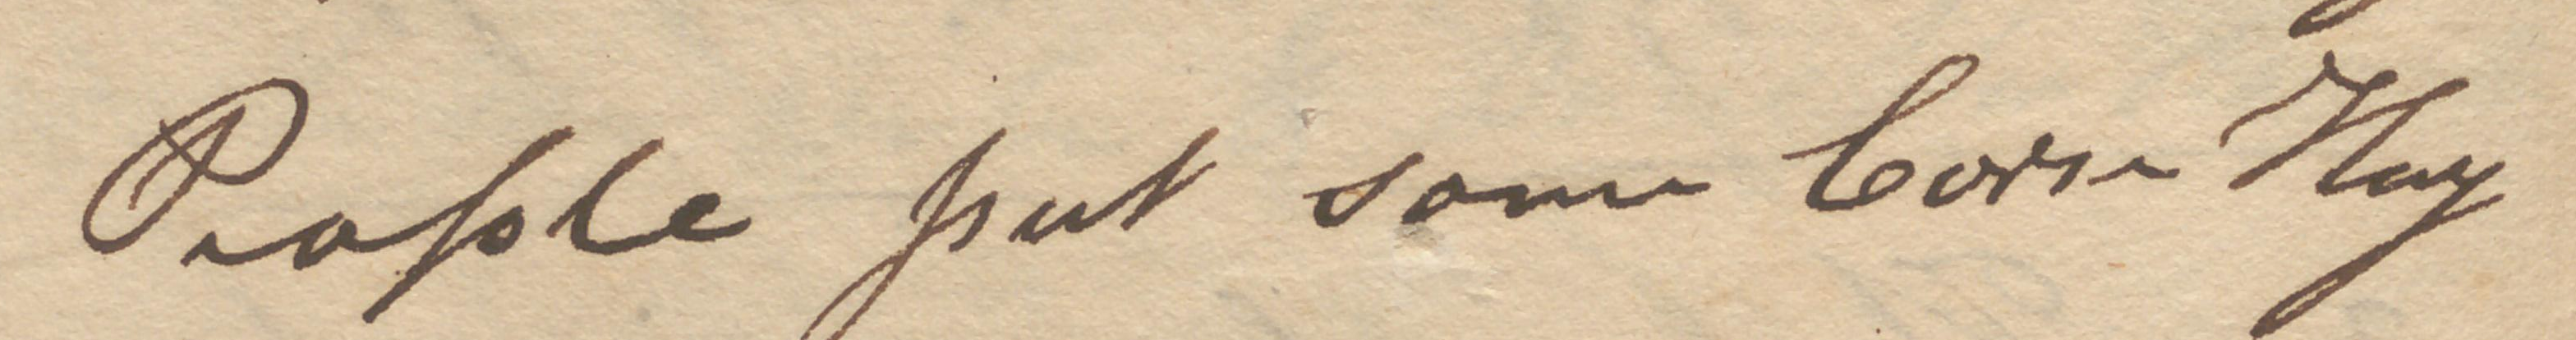People put some Corse Hay
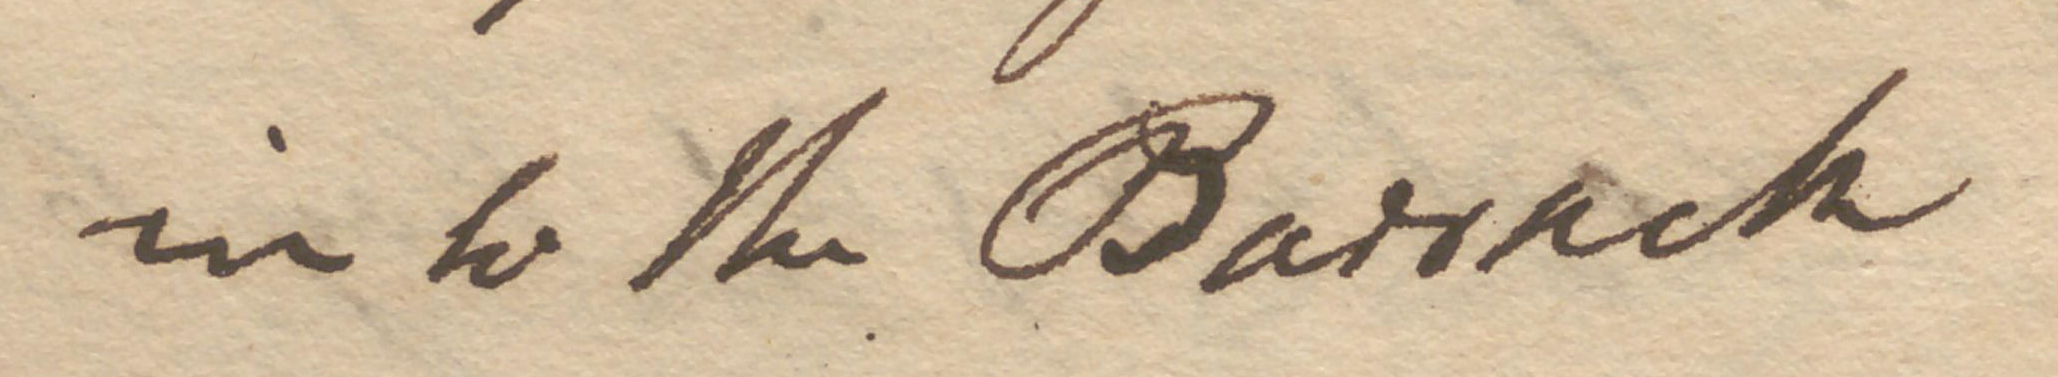in to the Barrack
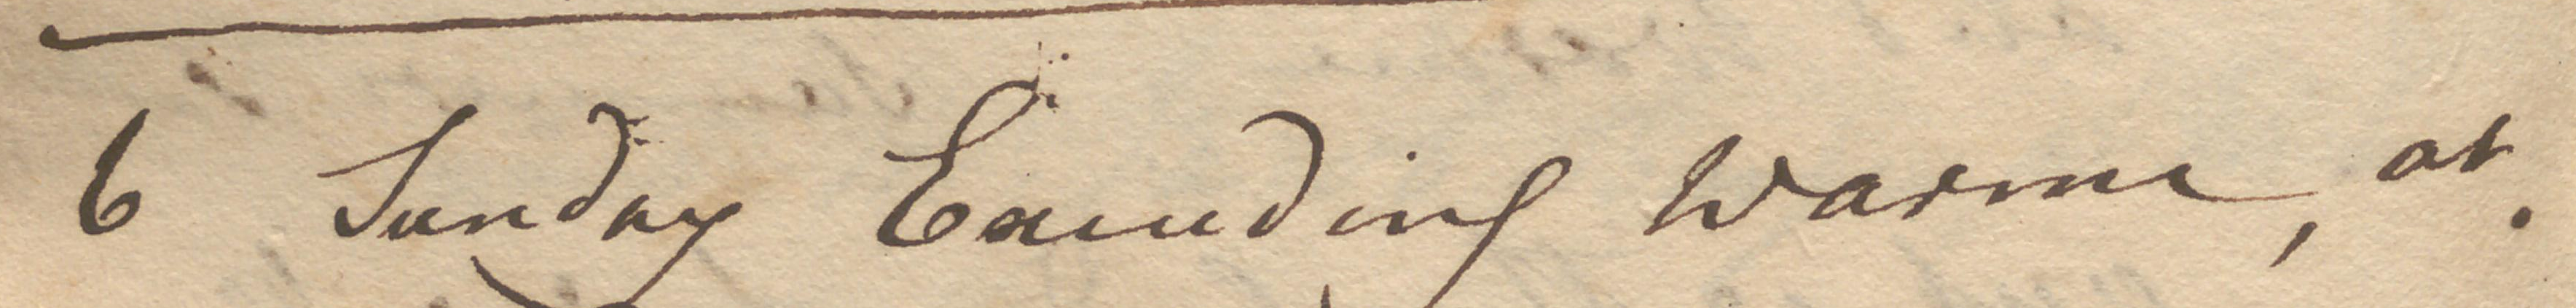6 Sunday Exceding warme at
